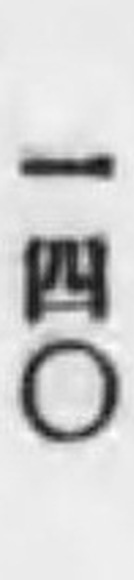一四〇
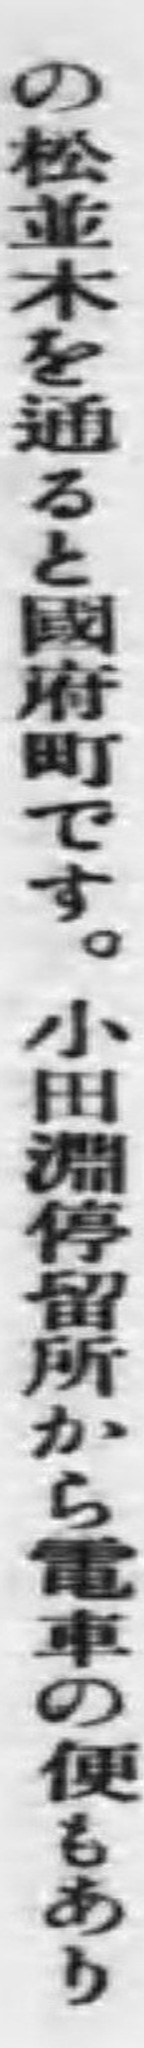の松並木を通ると国府町です。小田淵停留所から電車の便もあり
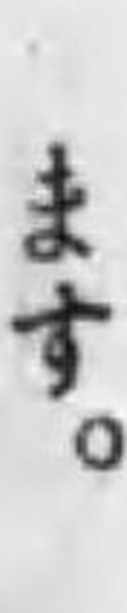ます。
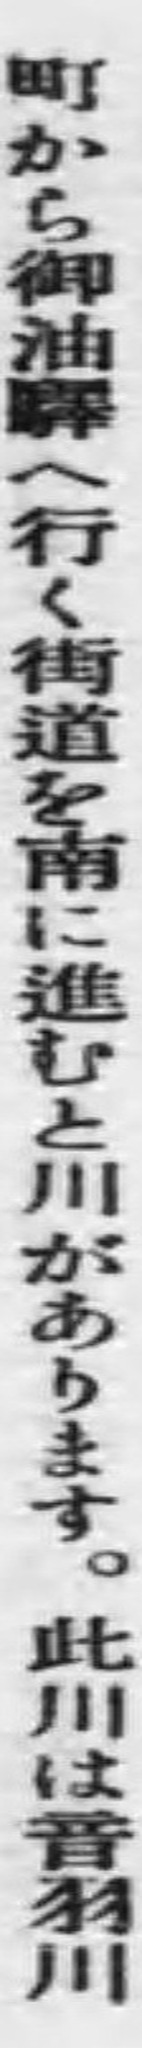町から御油駅へ行く街道を南に進むと川があります。此川は音羽川
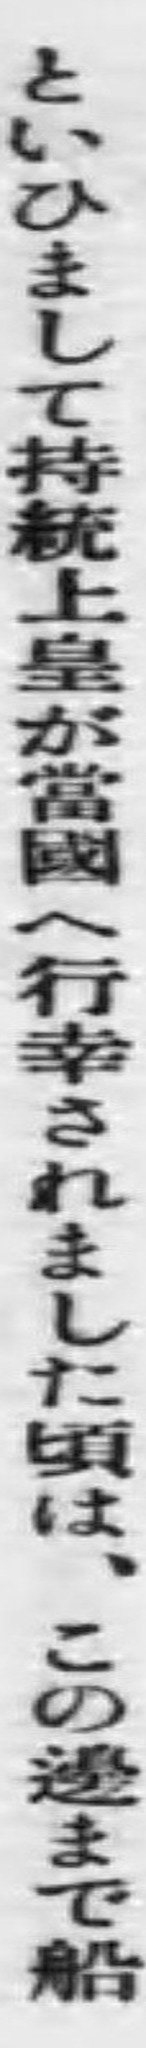といひまして持統上皇が当国へ行幸されました頃は、この辺まで船
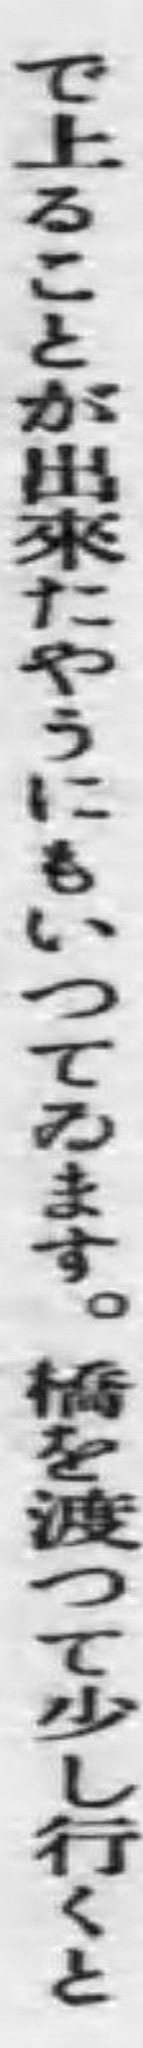で上ることが出来たやうにもいつてゐます。橋を渡つて少し行くと
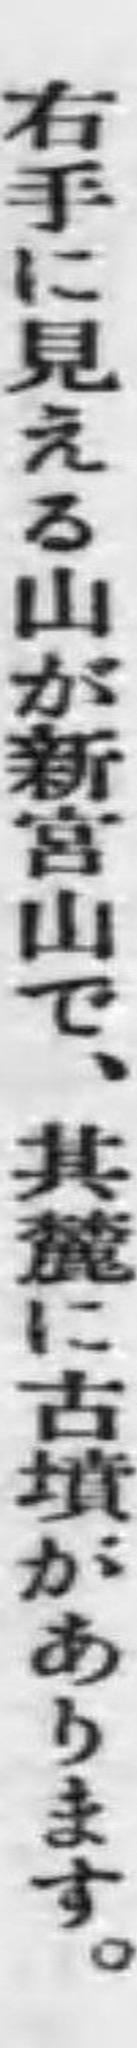右手に見える山が新宮山で、其麓に古墳があります。
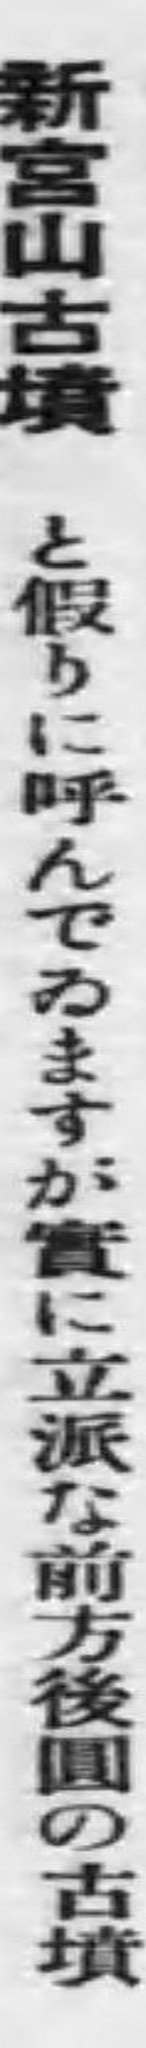新宮山古墳と仮りに呼んでゐますが実に立派な前方後円の古墳
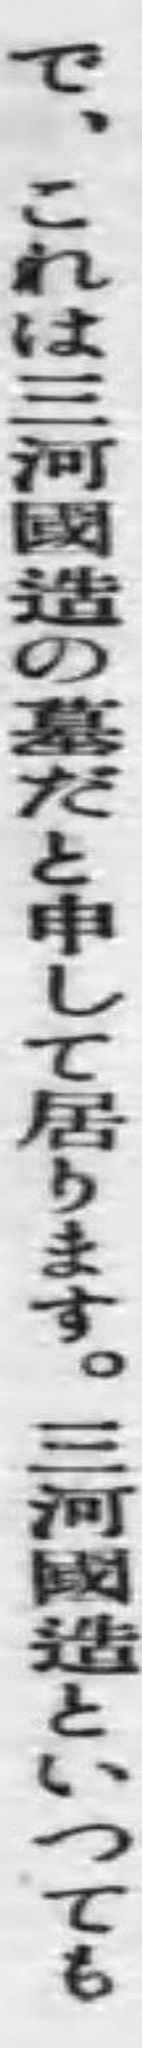で、これは三河国造の墓だと申して居ります。三河国造といつても
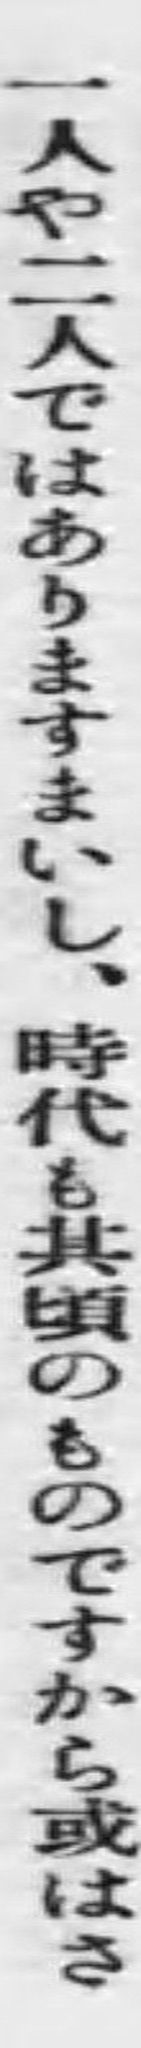一人や二人ではありますまいし、時代も其頃のものですから或はさ
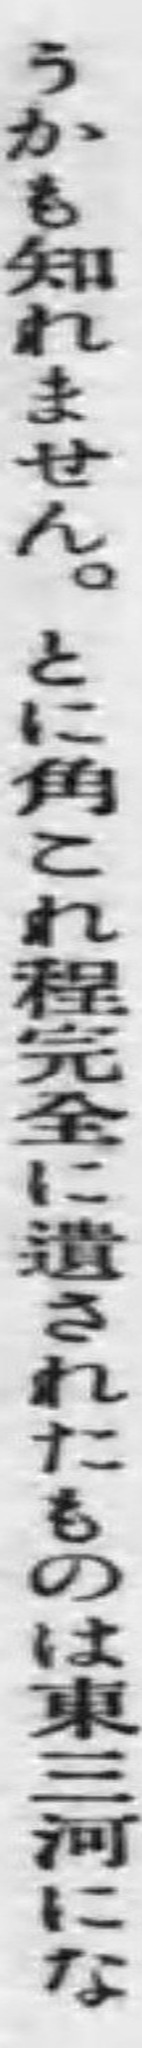うかも知れません。とに角これ程完全に遺されたものは東三河にな
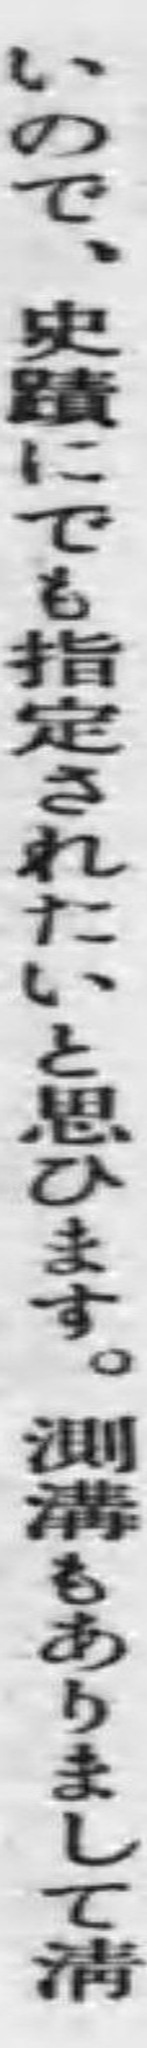いので、史蹟にでも指定されたいと思ひます。測溝もありまして清
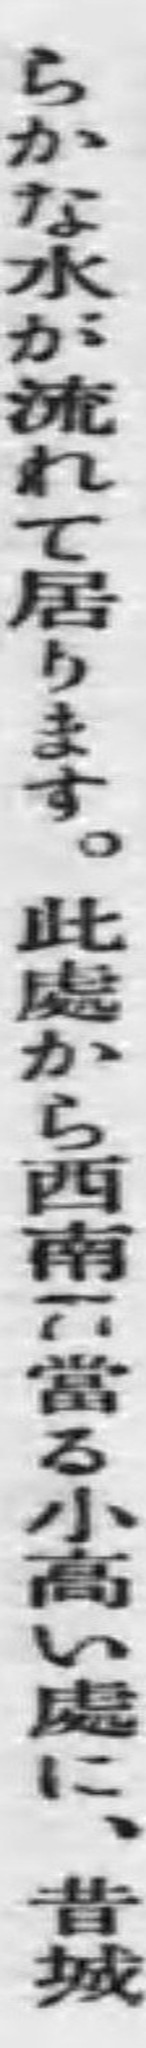らかな水が流れて居ります。此処から西南に当る小高い処に、昔城
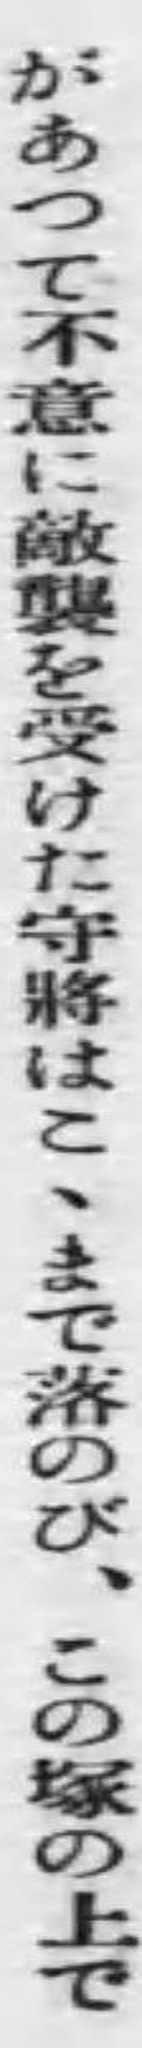があつて不意に敵襲を受けた守将はこゝまで落のび、この塚の上で
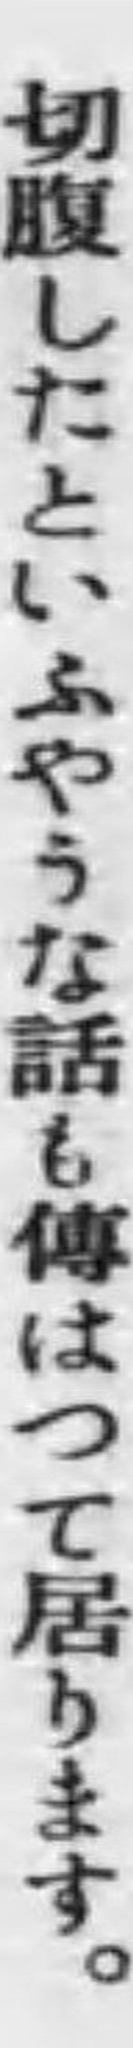切腹したといふやうな話も伝はつて居ります。
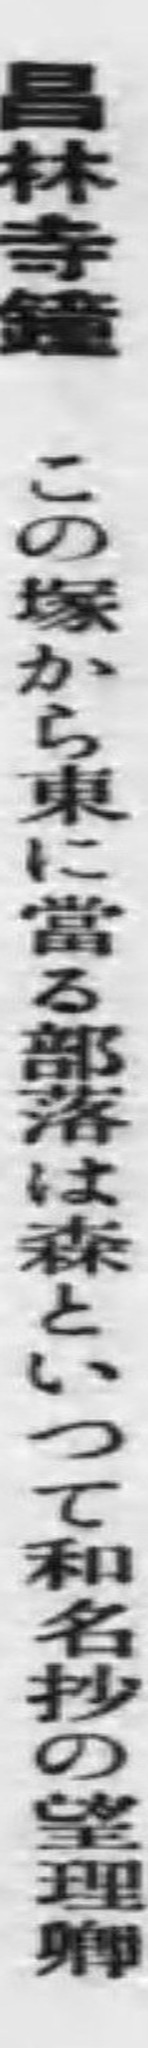昌林寺鐘この塚から東に当る部落は森といつて和名抄の望理卿
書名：東三河道中記 : 豊橋市及其附近案内
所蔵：国立国会図書館 National Diet Library, JAPAN
